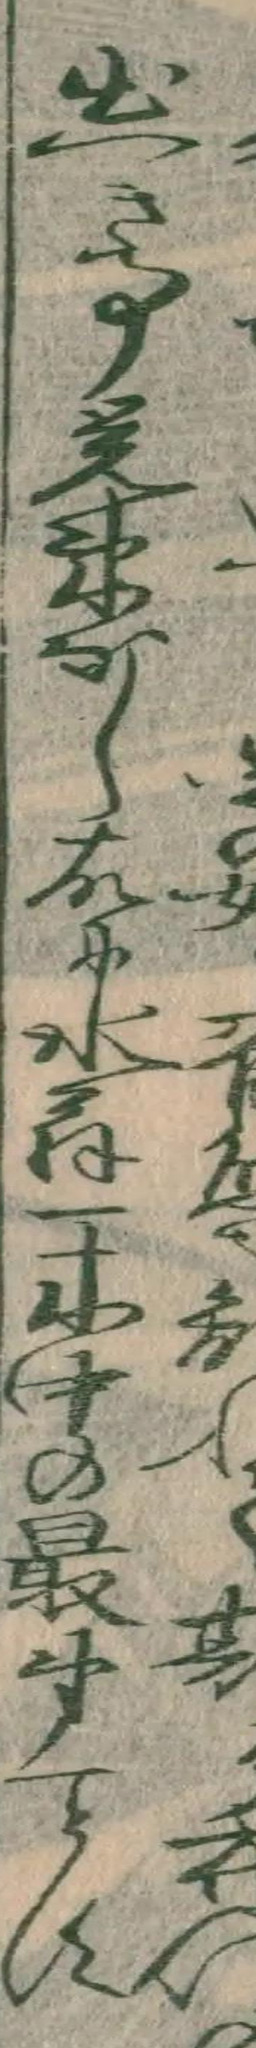出へき事覚束なし故に水翁一木中の最第一とす
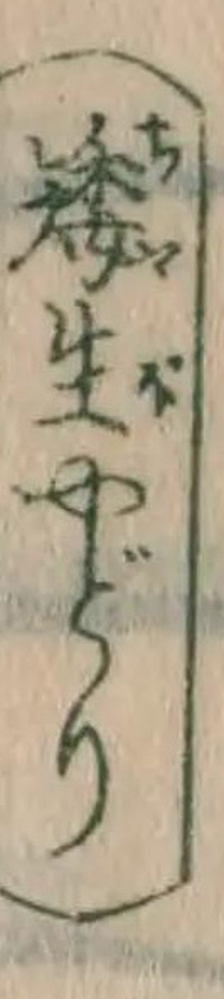矮生やどり
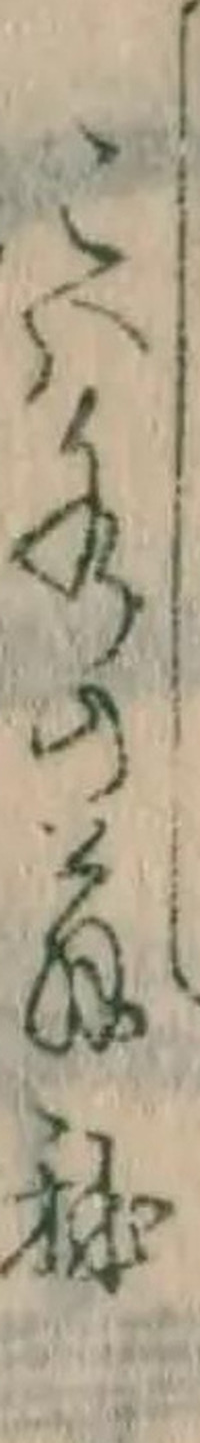こは水の翁秘
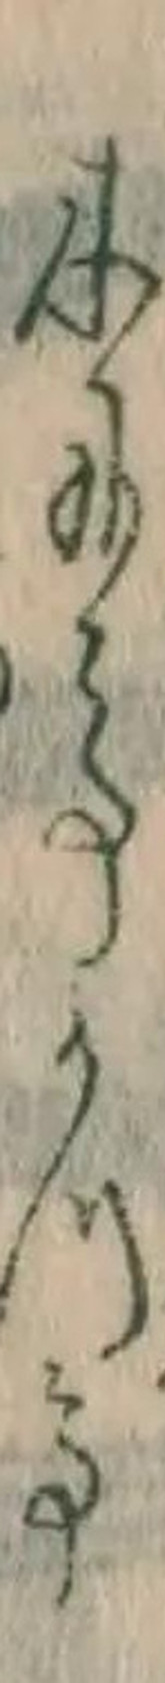木にてかつて
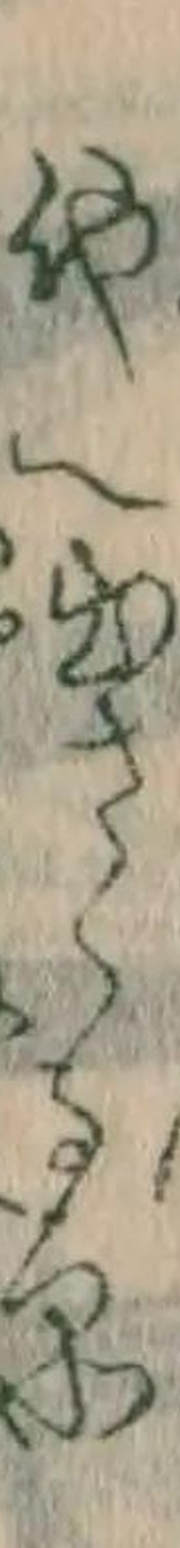他へ出さゝる品
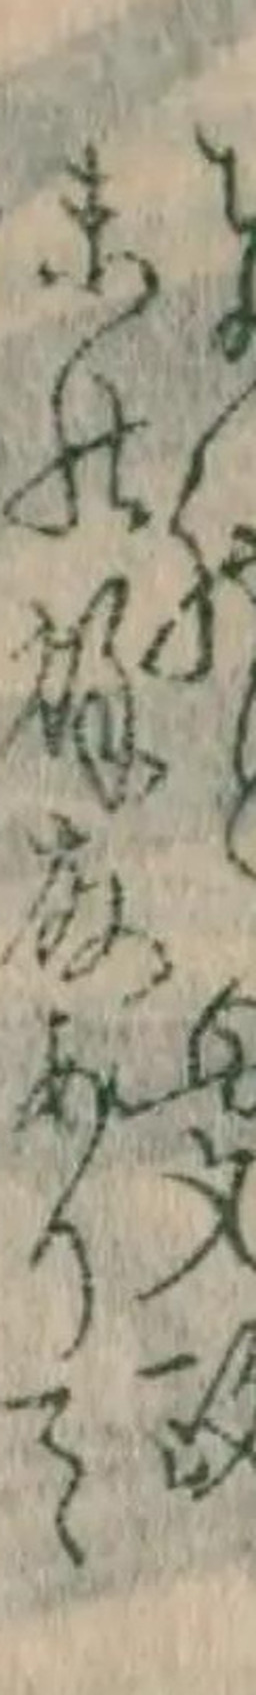末の秋故ありて
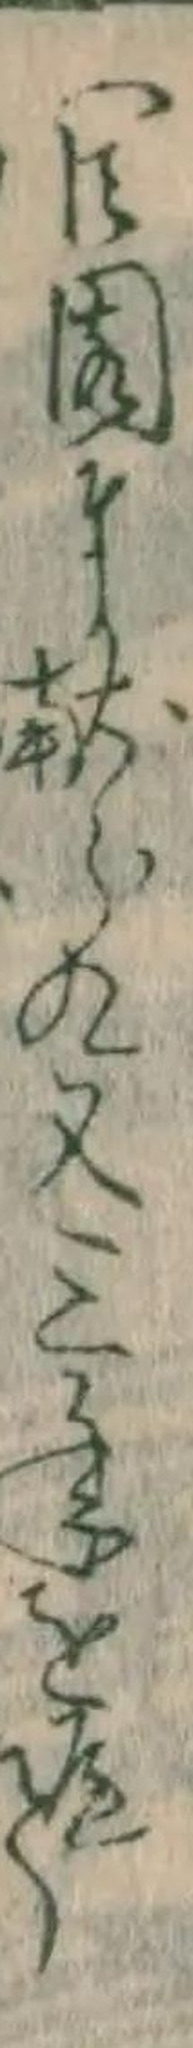臣園奉献られ又三年をへて
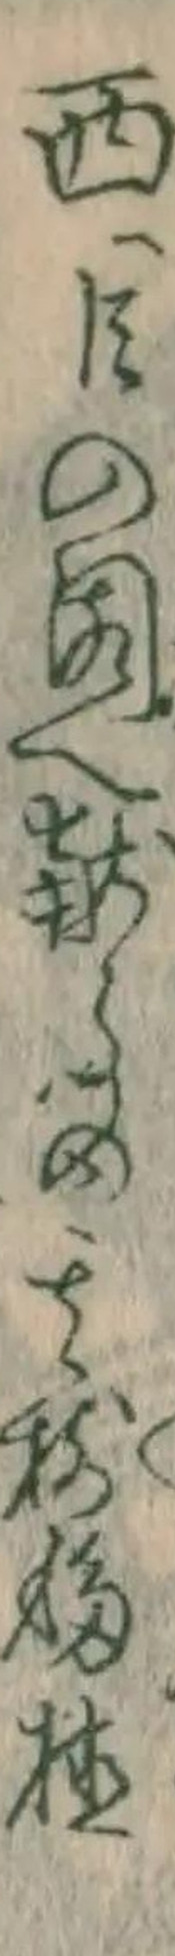西臣の園へ献るの其樹移植
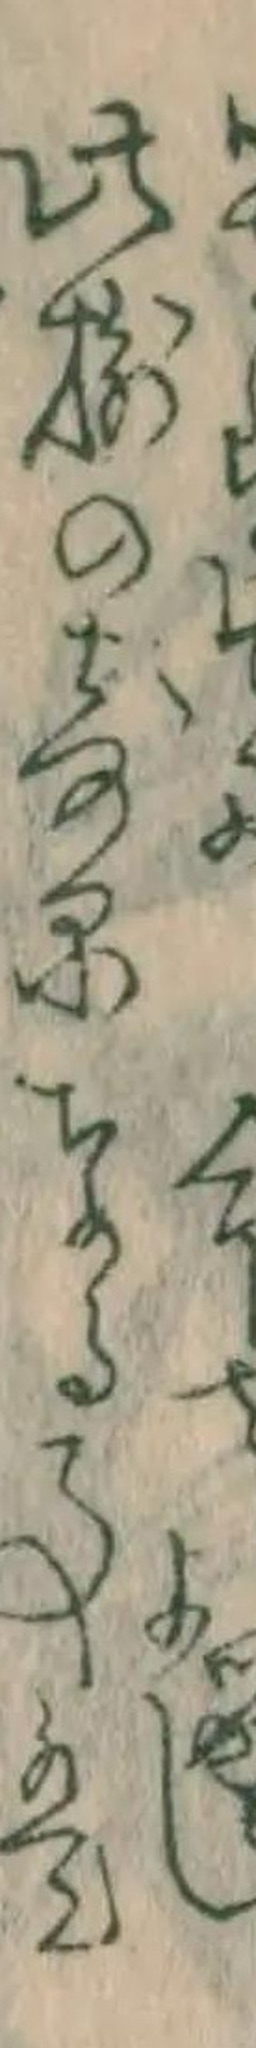此樹の奇品なる事は
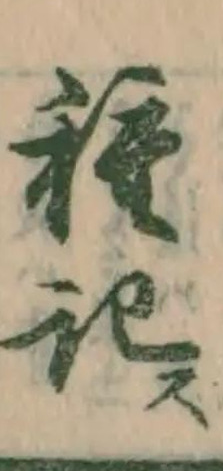種記す

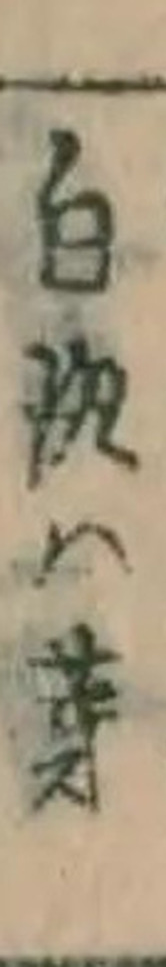白斑は芽
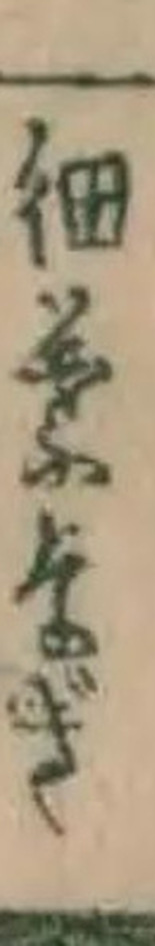細葉なぎ
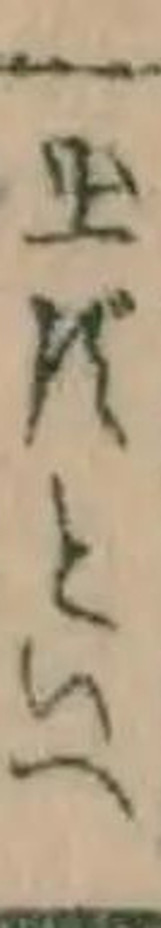出ずといへ
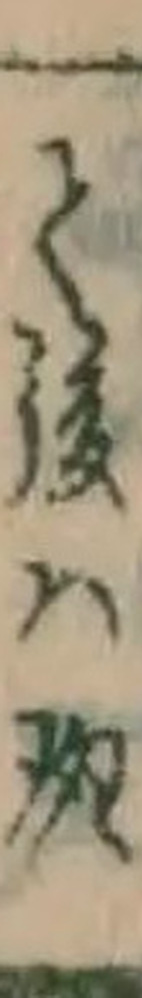て後は斑
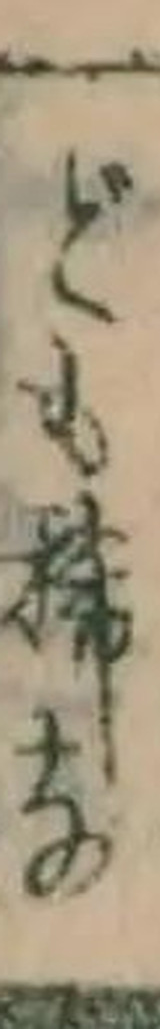ども稀な
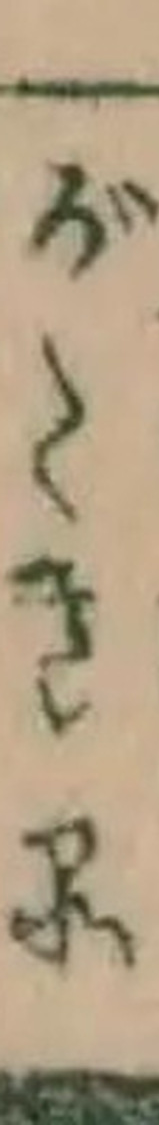がたき品
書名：草木奇品家雅見 3巻. [3]
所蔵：国立国会図書館 National Diet Library, JAPAN
